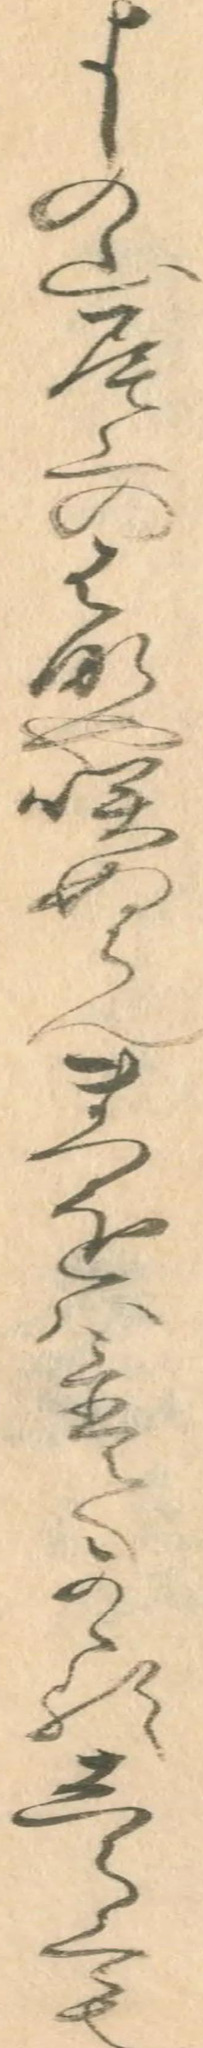よしの山尾上のはなや咲ぬらんまつをは置てかゝるしらくも
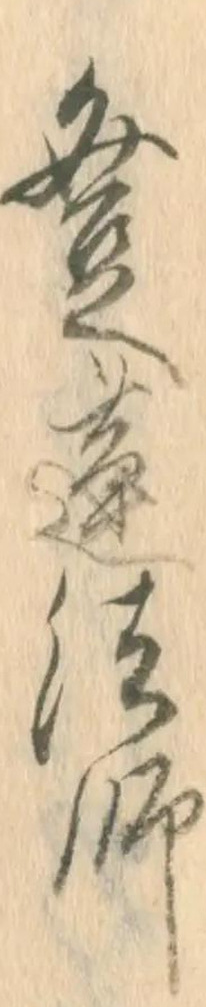登蓮法師
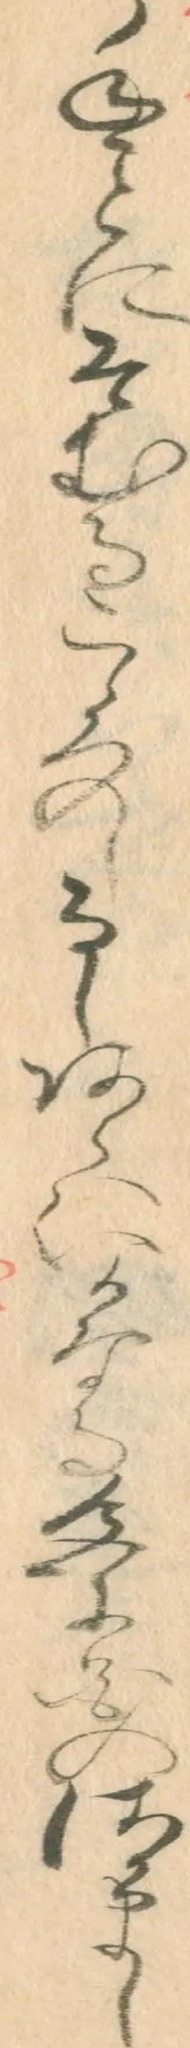年ことにそむるこゝろのしるしあらはいかなる色に花のさかまし
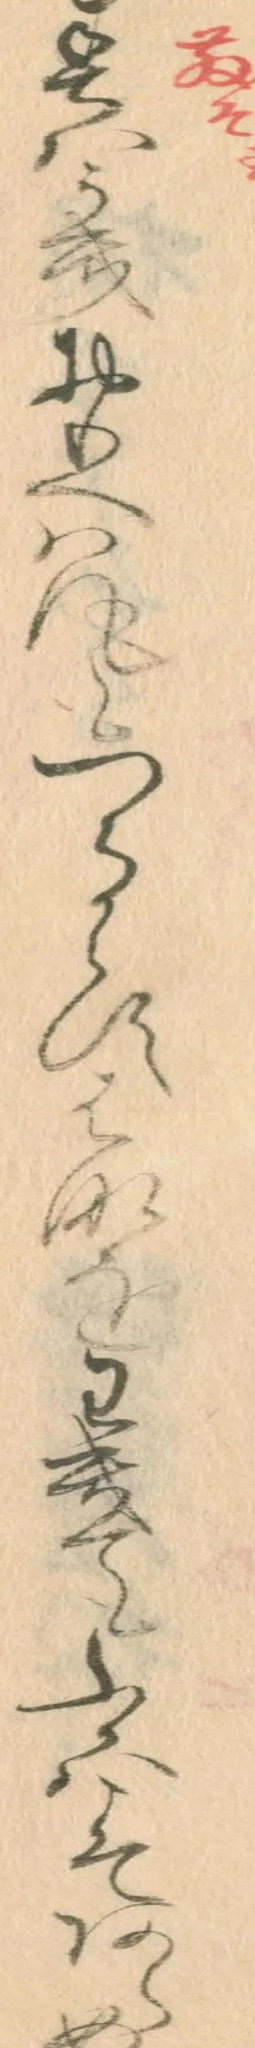春はうきおもへは風もつらからすはなをわきてもふかはこそあらめ
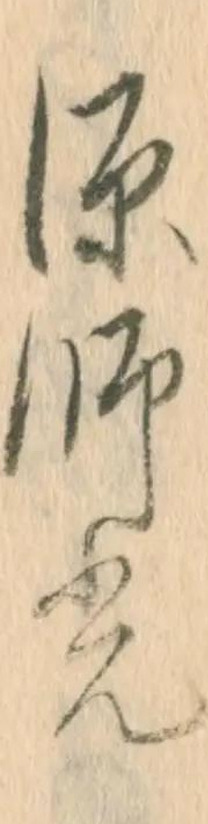源師光
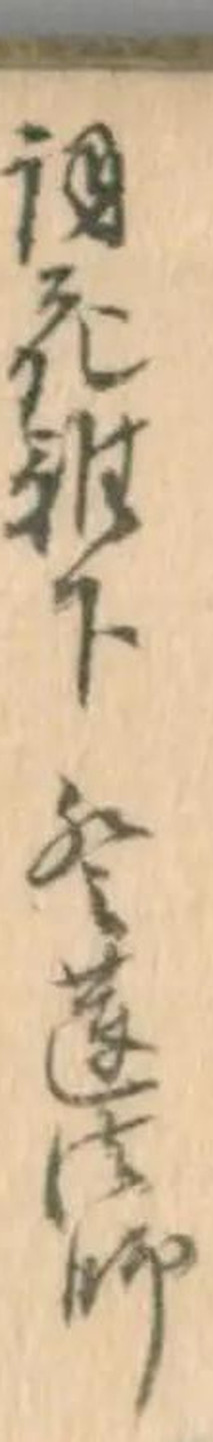詞花雑下登蓮法師
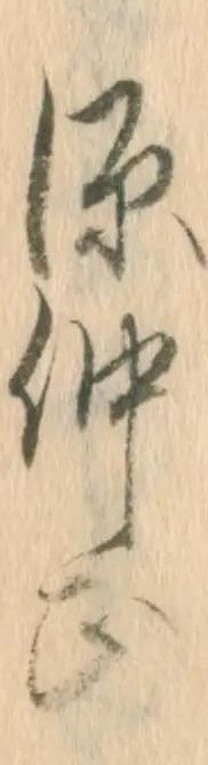源仲正
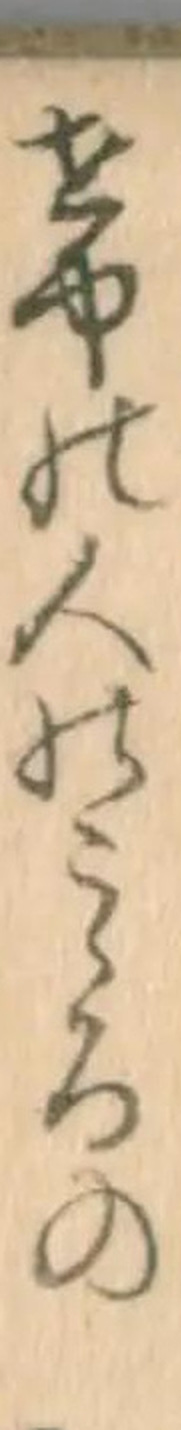世中の人のこゝろの
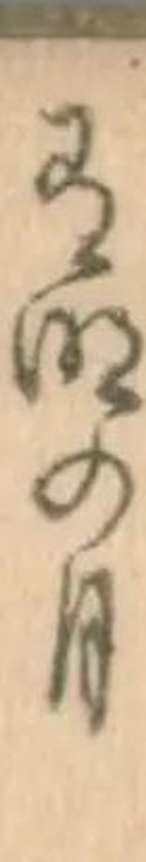有明の月
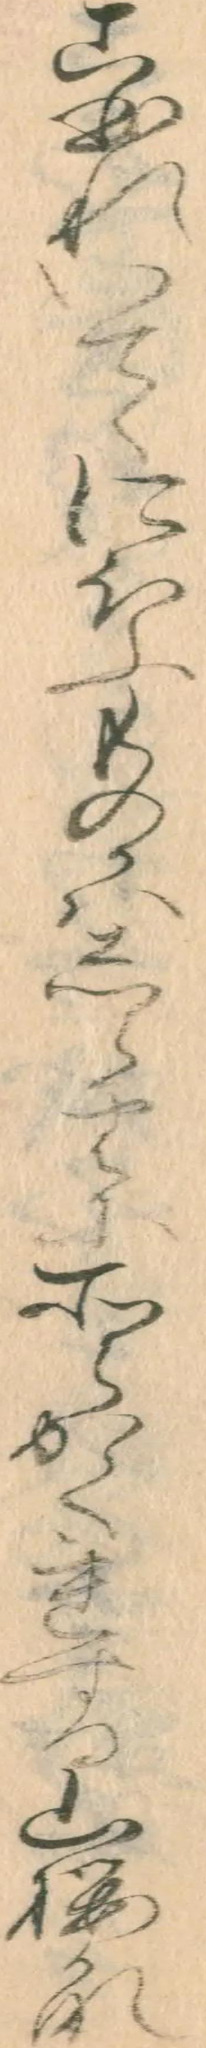こほれいてゝにほふものかはしら雲にそらかくれする山桜かな
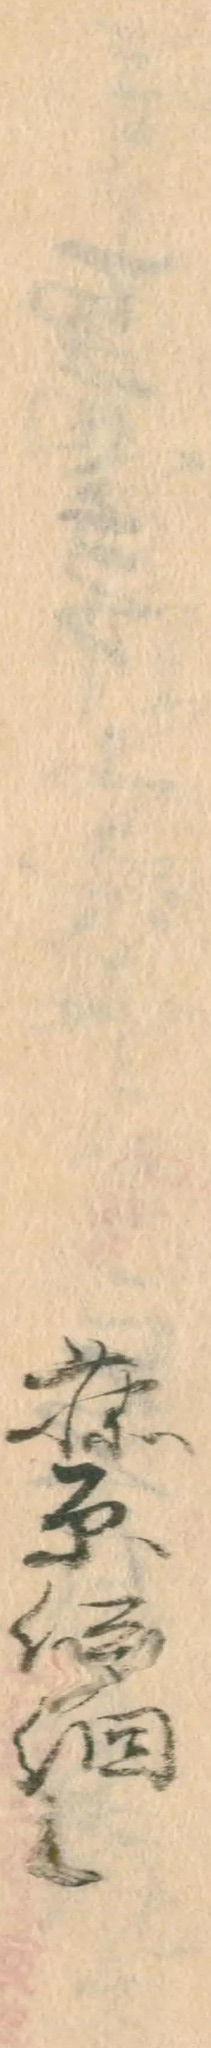藤原伊綱
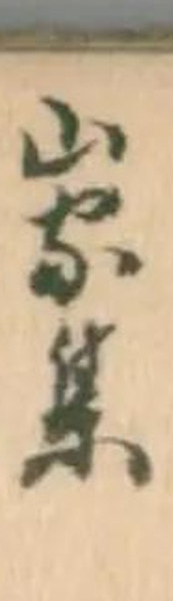山家集
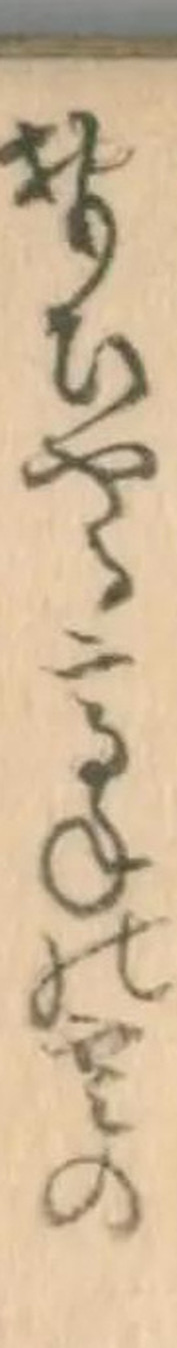おもひやる高ねの雲の
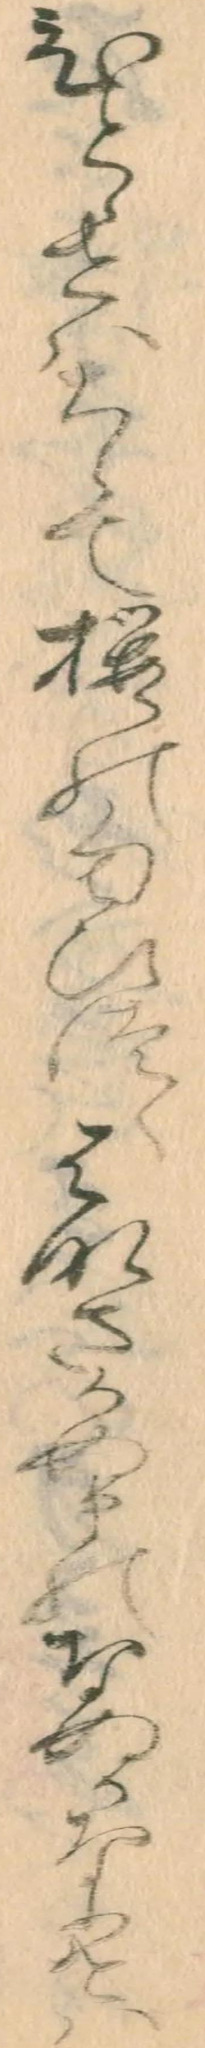ひとゝせはちらて桜の匂ひつゝはなさかぬまのなぬかなりせは
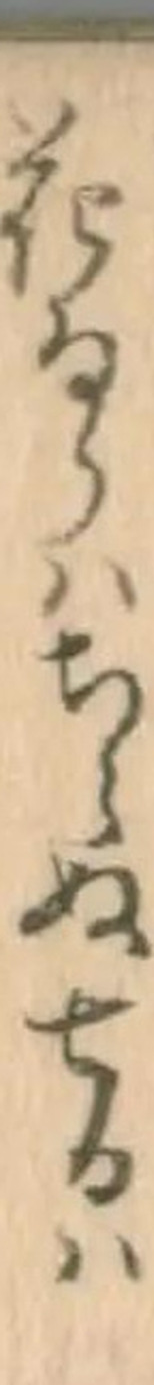花ならはちらぬ七日は
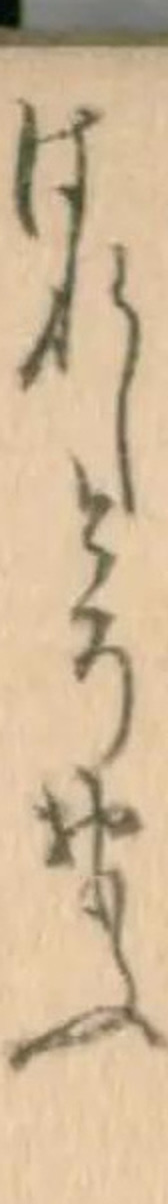はれしとそおもふ
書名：月詣和歌集
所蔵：国立国会図書館 National Diet Library, JAPAN
